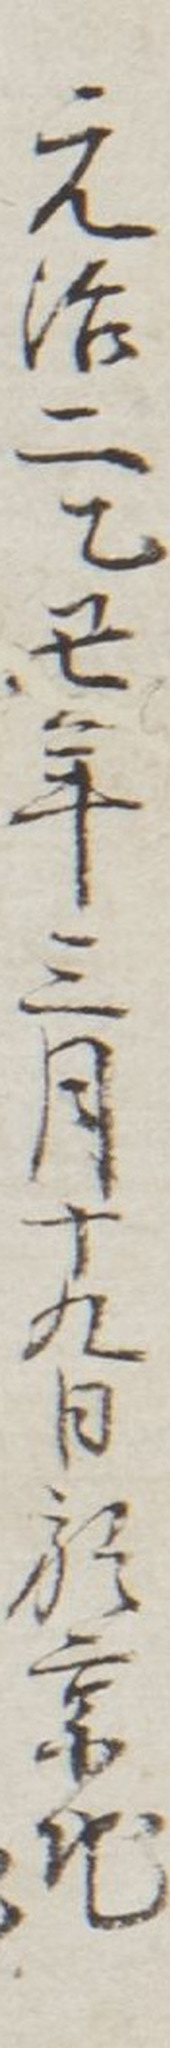元治二乙丑年三月十九日於京地
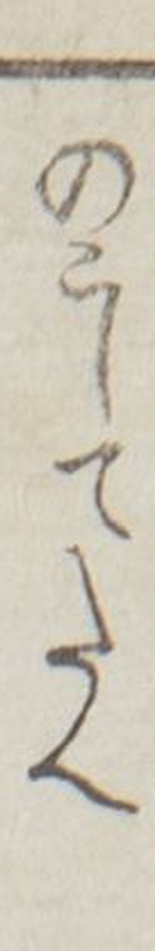のこしてたへ
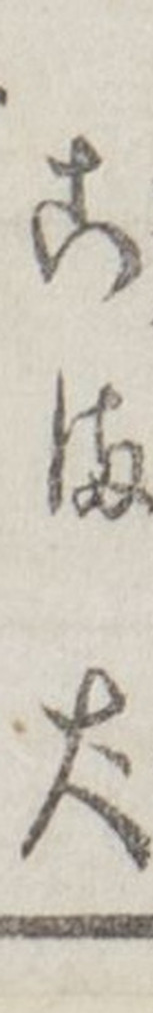こま犬
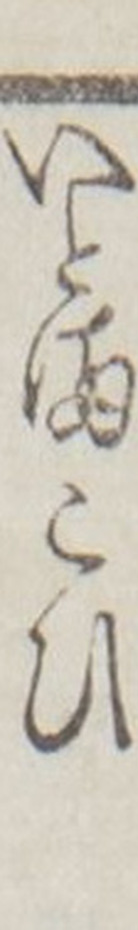いとまこひ
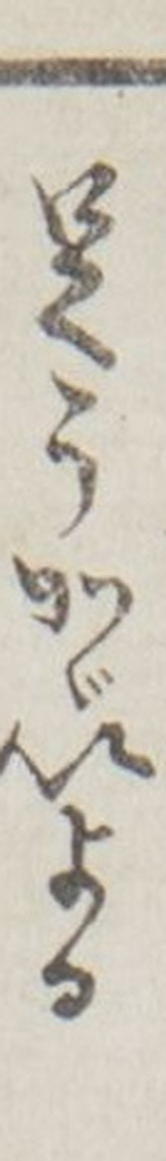足うかゞいよる
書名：京都大火大功記十段目抜文句
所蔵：あいおいニッセイ同和損保株式会社
